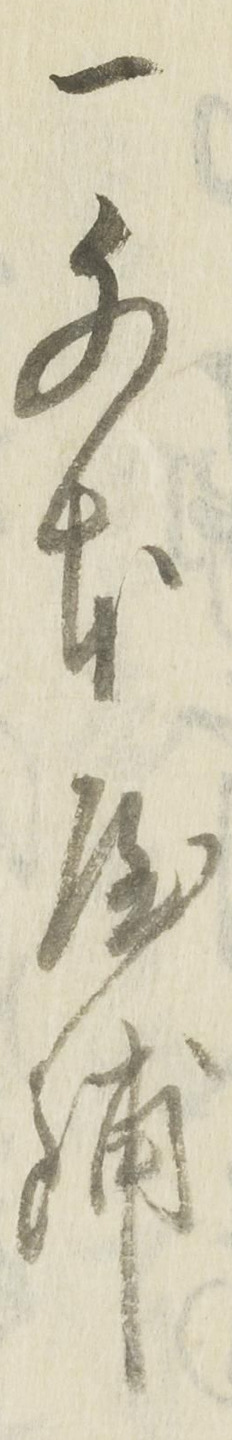一千本屋舗
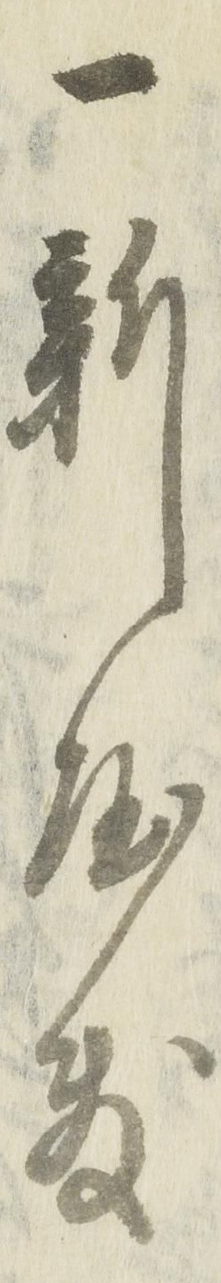一新屋敷
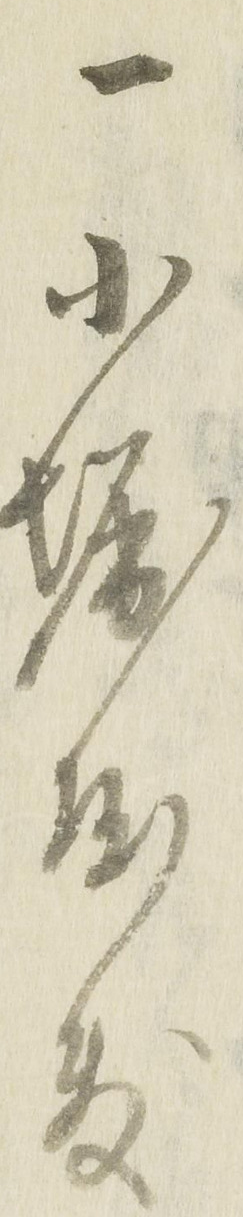一小堀屋敷
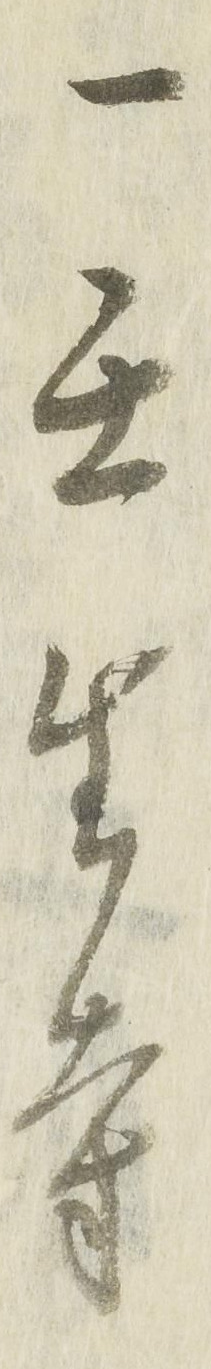一壬生寺
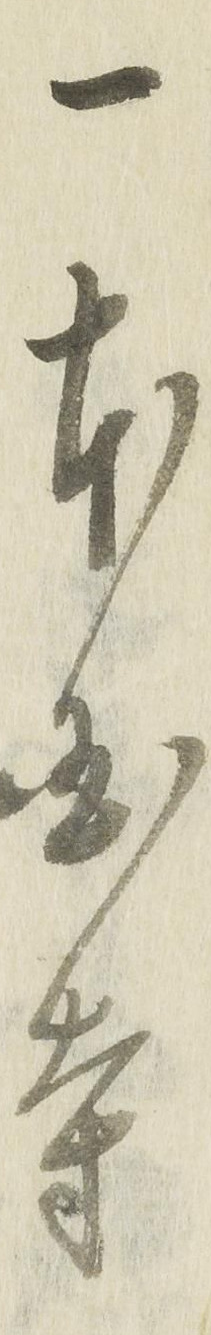一本国寺
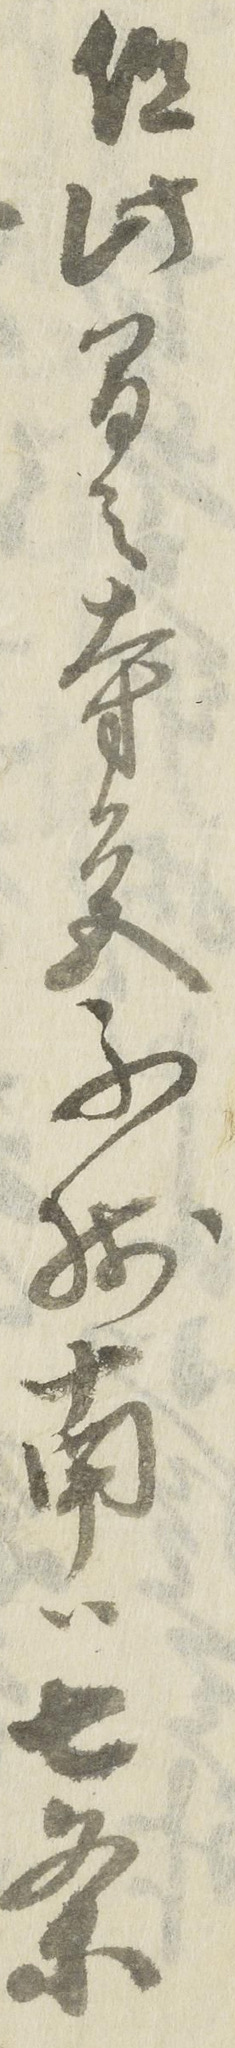但此間之寺宮不残南は七条
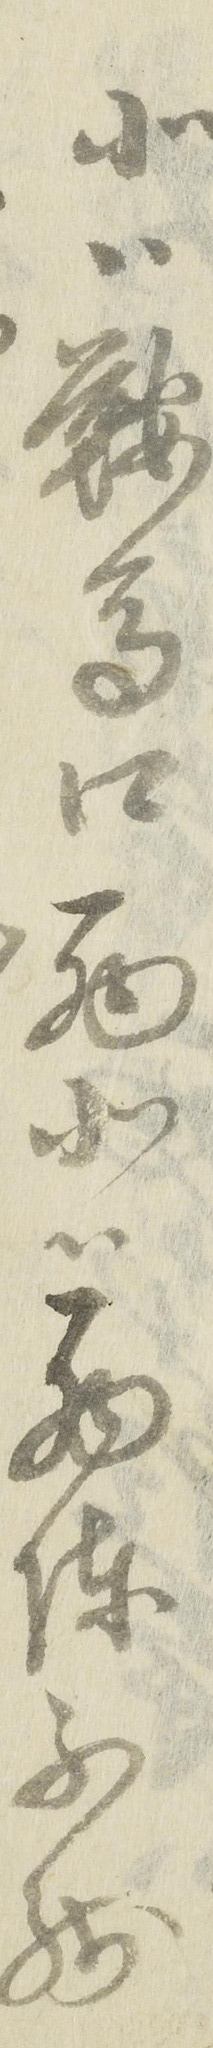北は鞍馬口西北は西陣不残
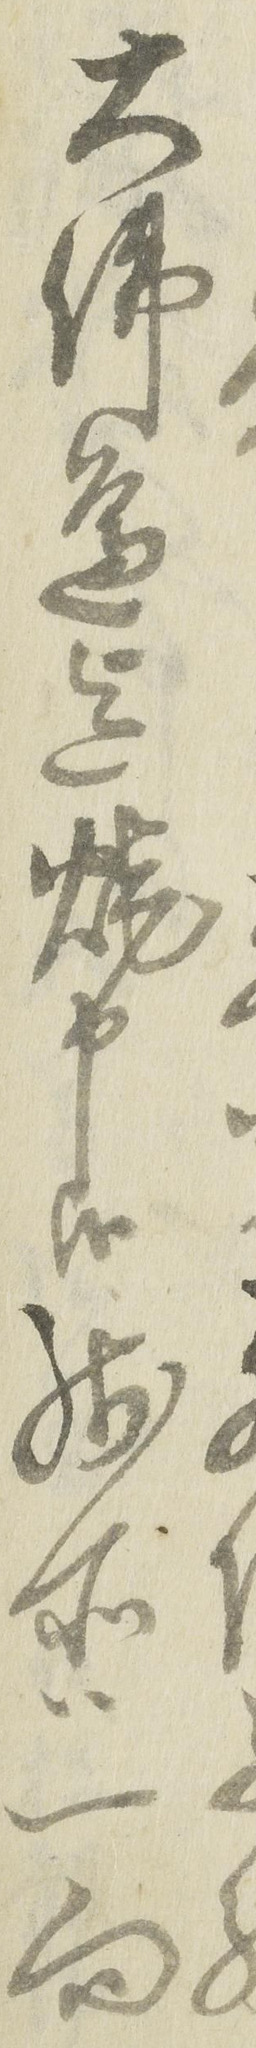大仏辺迄焼申候残所は一向

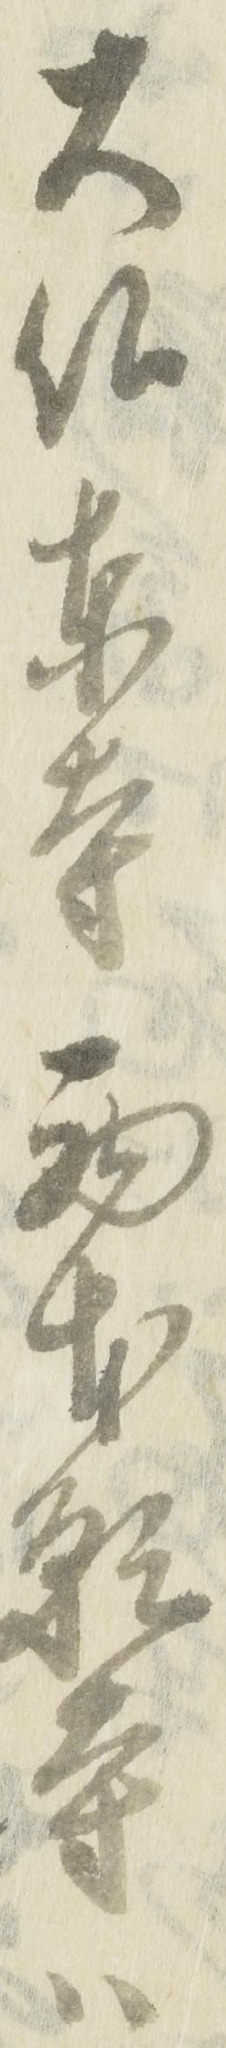大仏東寺西本願寺は
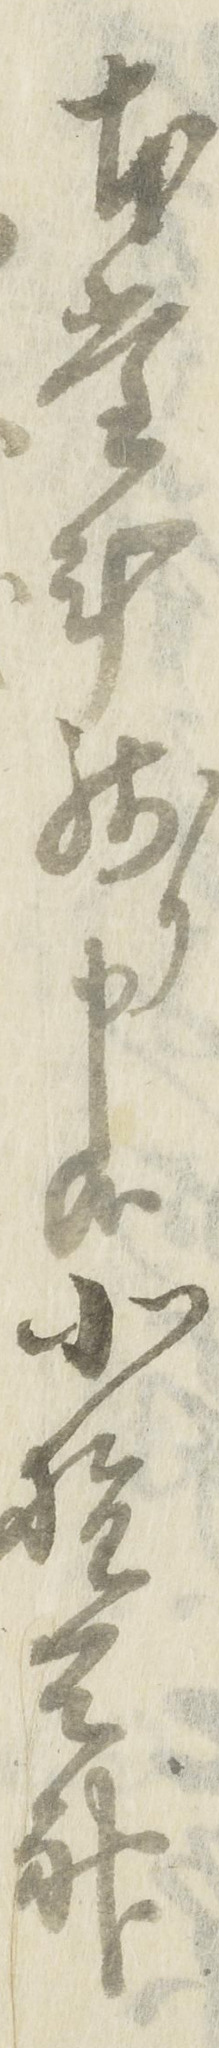本堂計残り申候北野其外
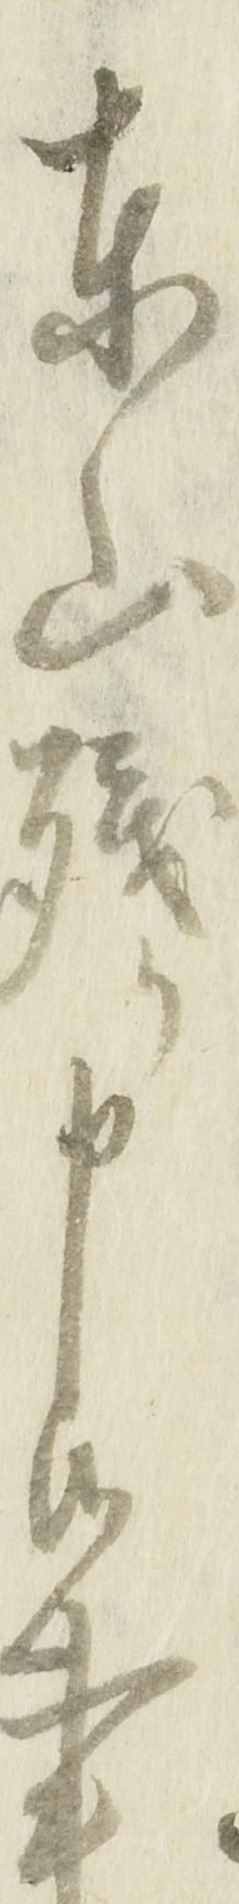東山残り申候事
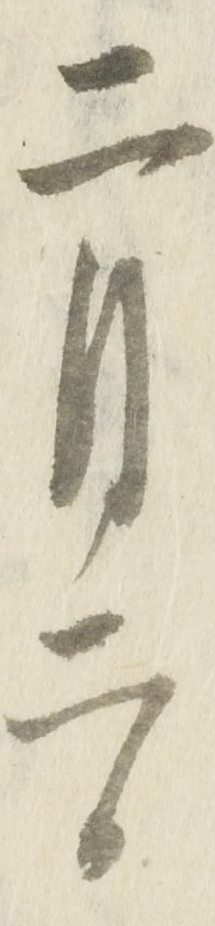二月二日
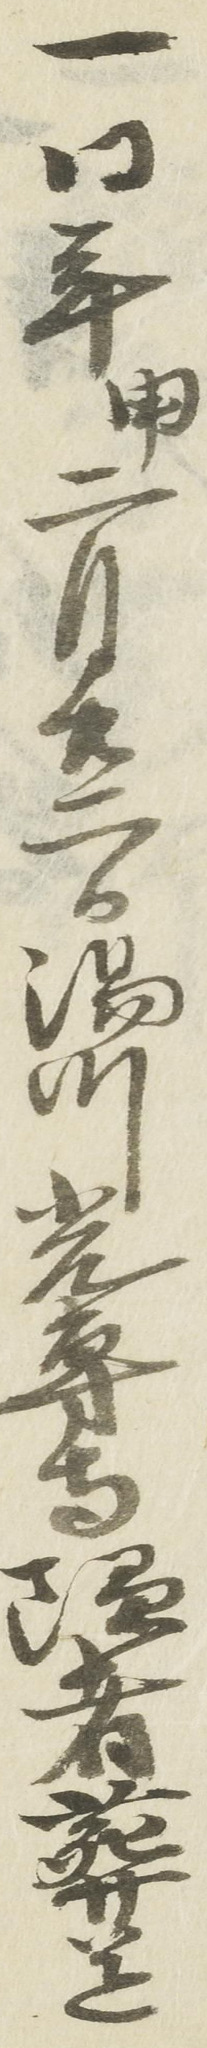一同年申二月廿二日湯川光専寺隠者葬いを
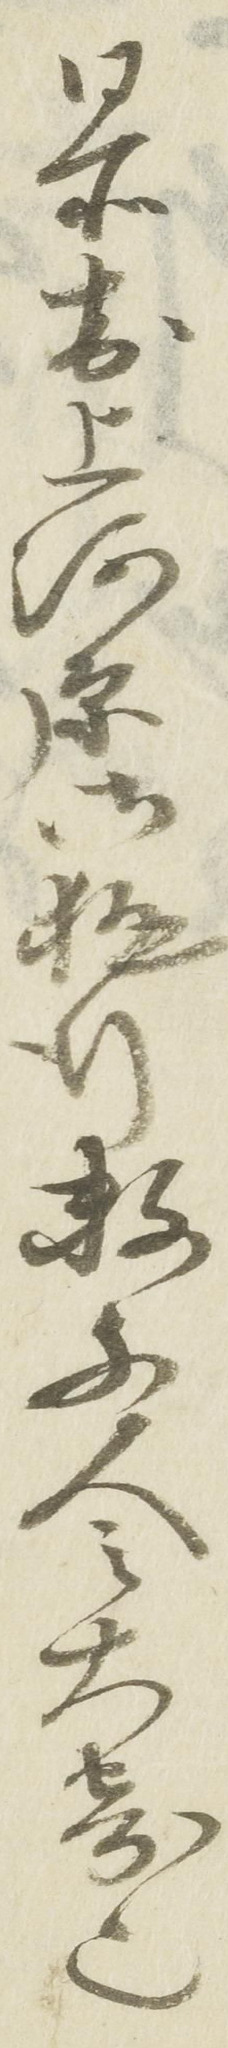同所於上河原御執行数千人之大寄也
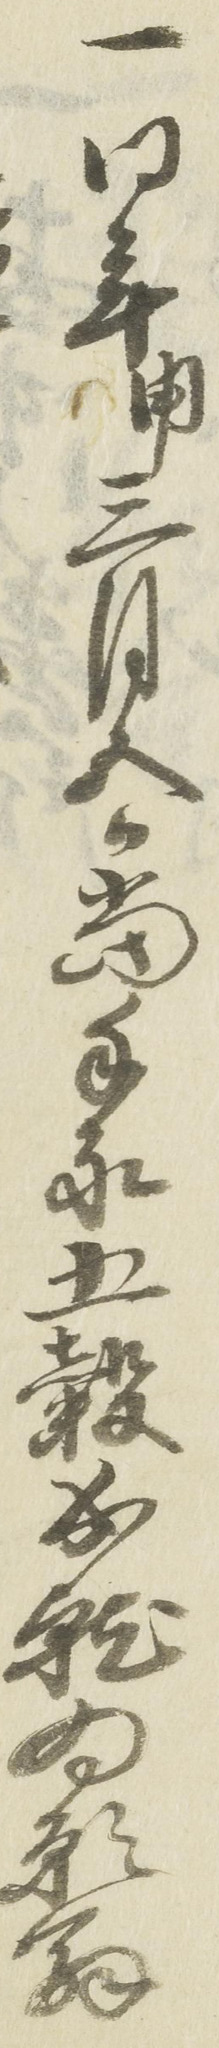一同年申三月五日当手永五穀成就為願翁
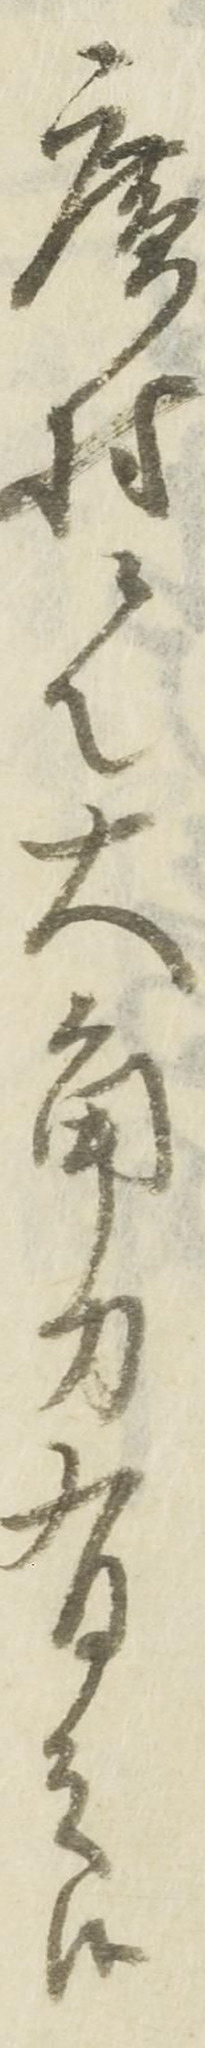廣村ニて大角力有之候
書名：後見笑
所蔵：東京大学地震研究所図書室 Earthquake Research Institute Library, The University of Tokyo, JAPAN
